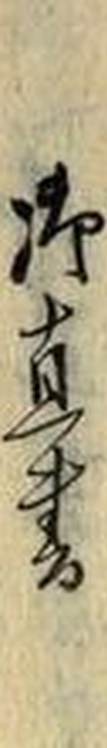御直書
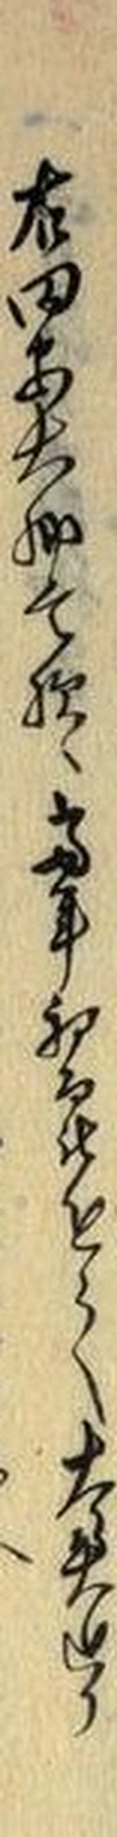右田安大納言様へ当年初而被進之大奥廻り
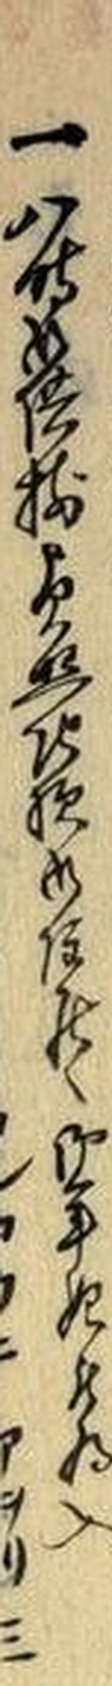一八時御供揃貞照院様御住居へ御年始被為入
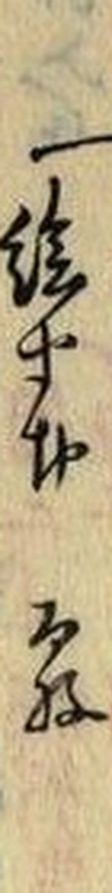絵半切百枚
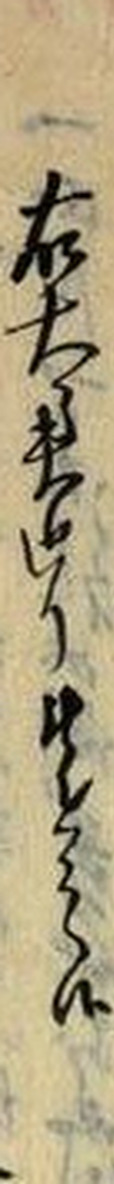右大奥廻り被進之候
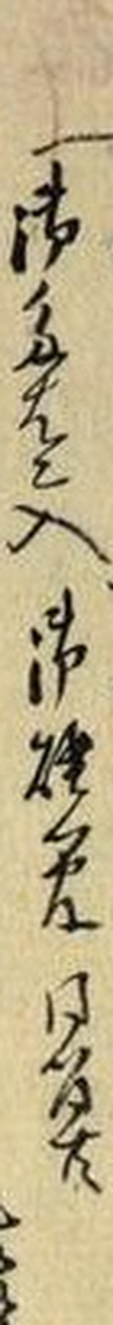御たはこ入御煙管同筒共
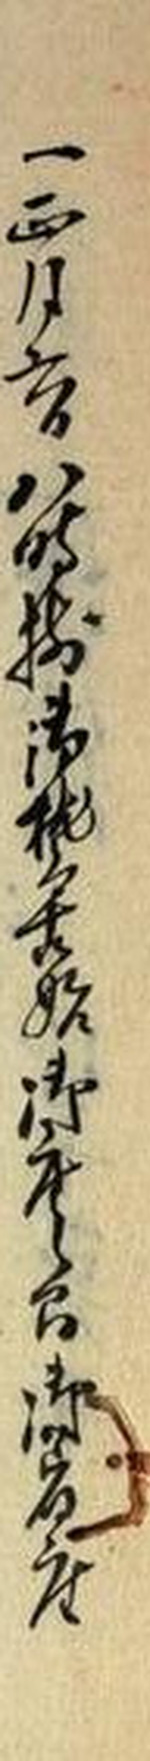一正月六日八時揃御稽古始御座之間御着座
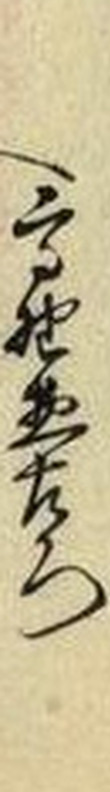高野惣左衛門
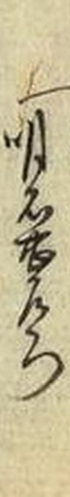明石甚左衛門
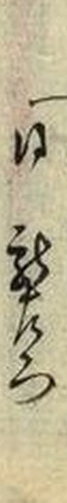同新左衛門
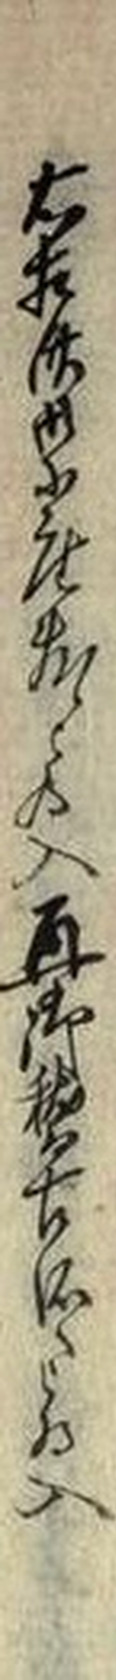右相済御小座敷へ被為入再御稽古所へ被為入
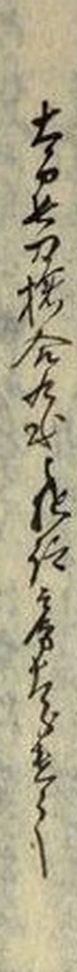太刀長刀槍合九本被遊跡房太郎遣之
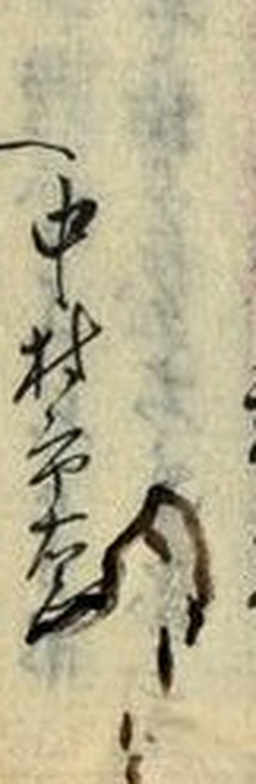中村市右衛門
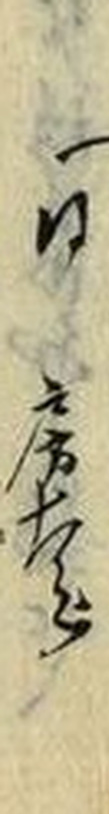同房太郎
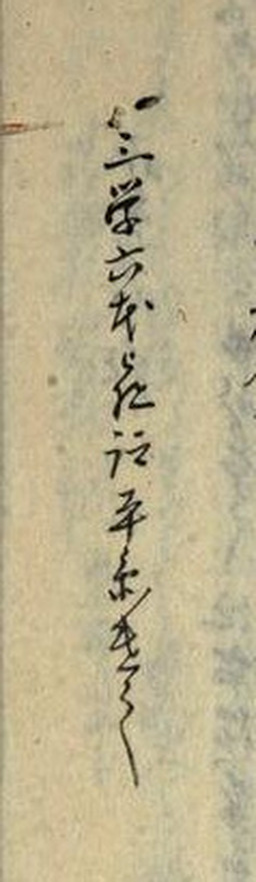三学六本被遊跡平兵衛遣之
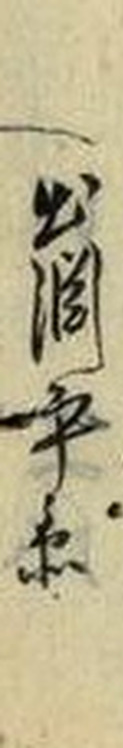出渕平兵衛
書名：少傅日録抄（斉承付側向頭取日記、在国）
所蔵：福井県文書館 Fukui Prefectural Archives
